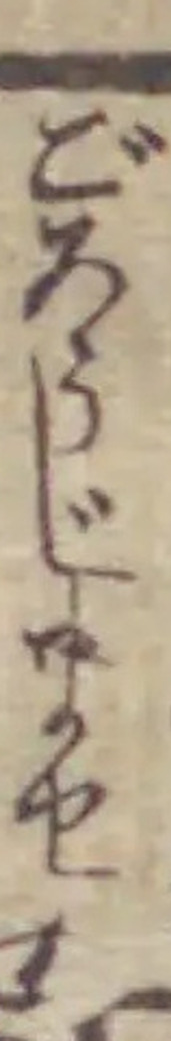ごろうじませ
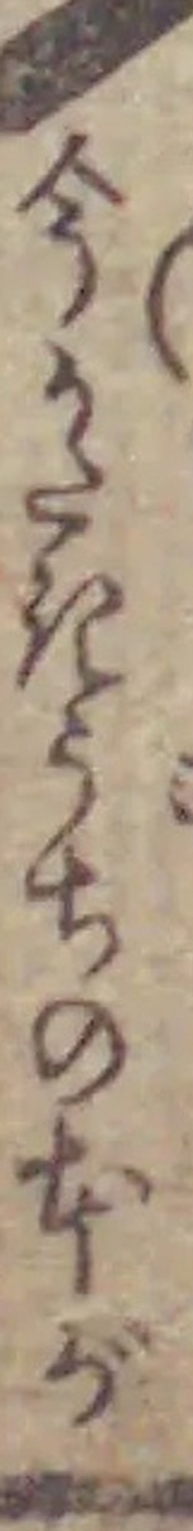今かたきうちの本が
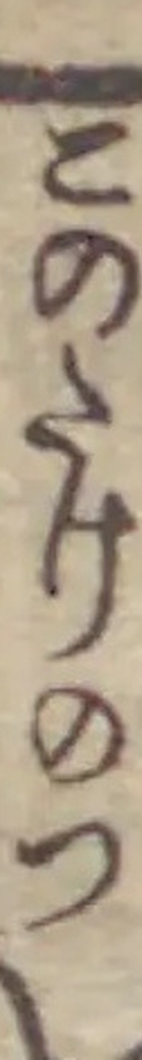このたけのつ
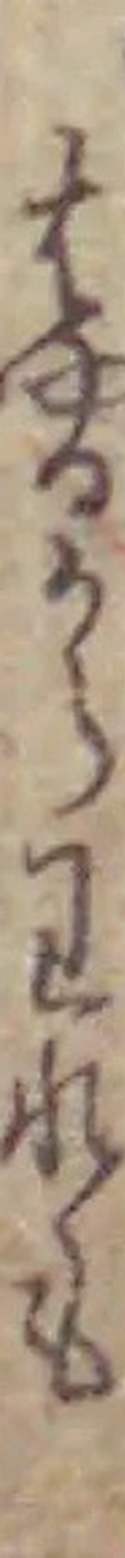はやるからわれも
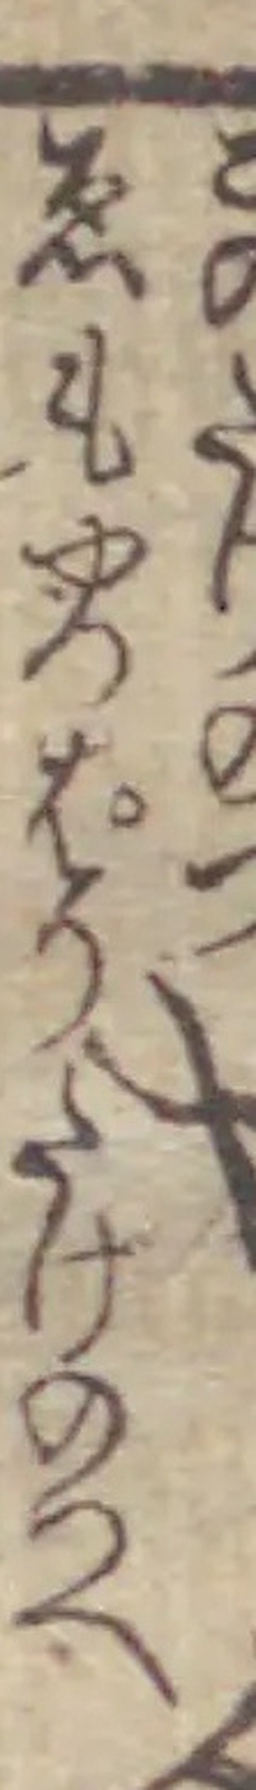ゑもやつぱりたけのつへ
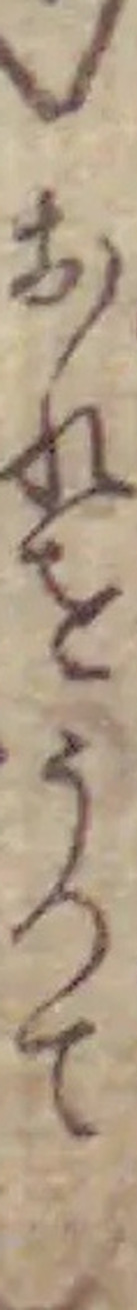おれをうつて
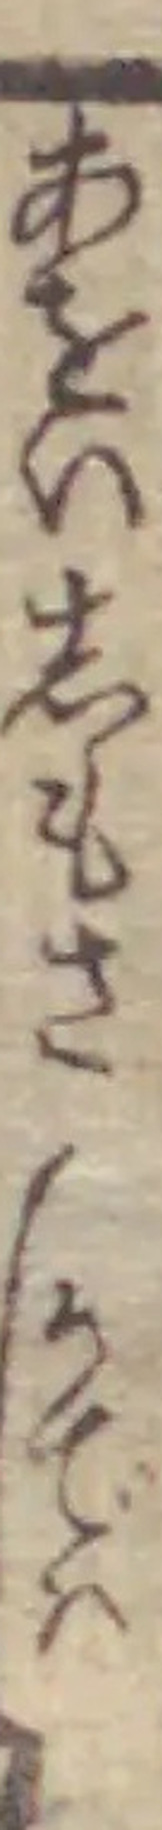あをいしもさうでは
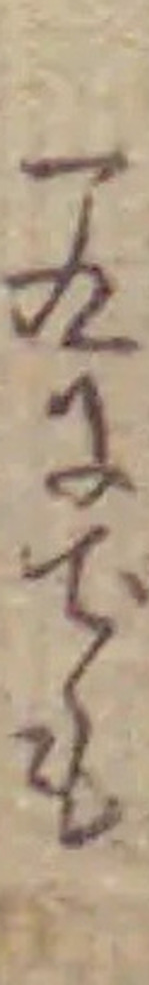一九にでも
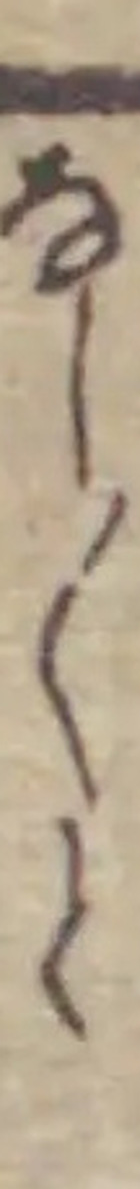なし〳〵と
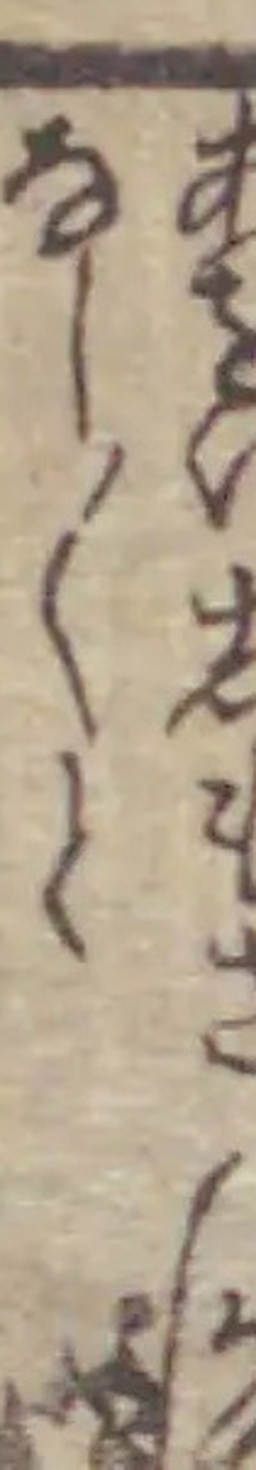なし〳〵と
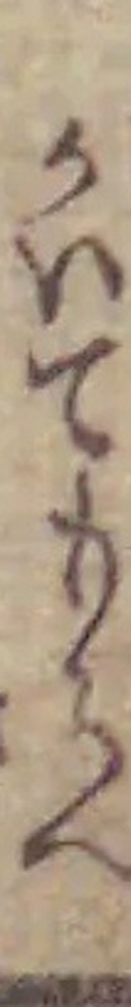かいてもらへ
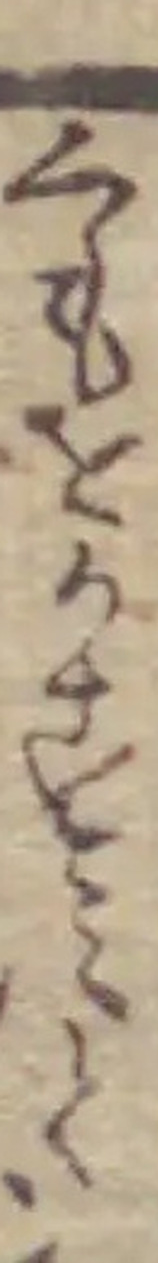くもをかすみと
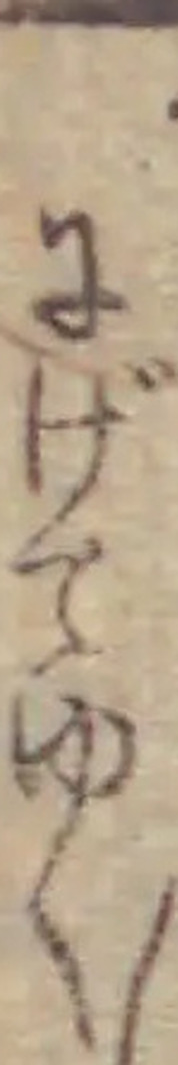にげてゆく

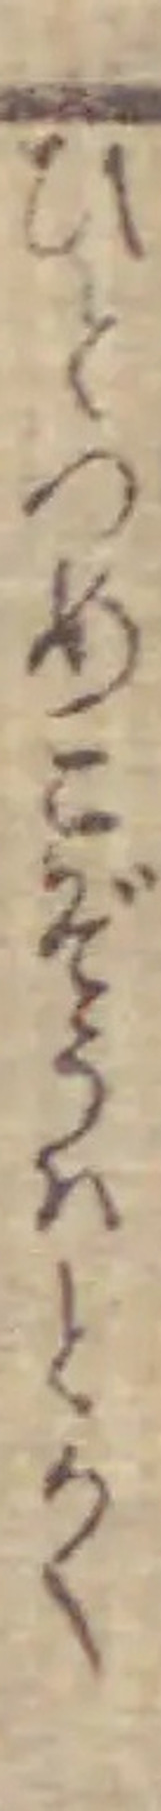ひとつめこそうはとかく
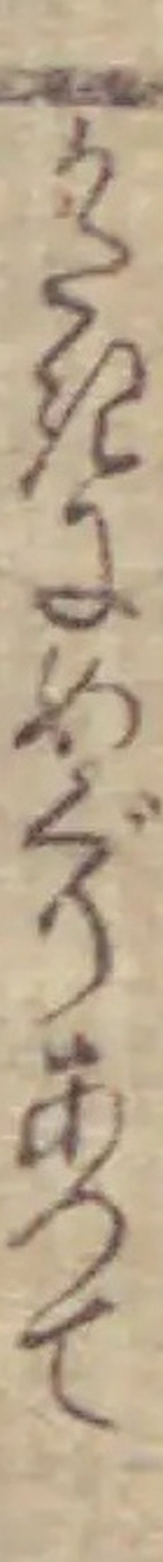かたきにめぐりあつて
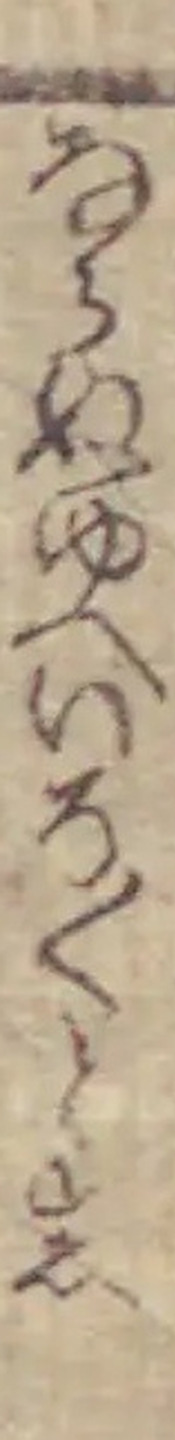ならぬゆへいろ〳〵とし
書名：化物敵討 2巻
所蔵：国立国会図書館 National Diet Library, JAPAN
